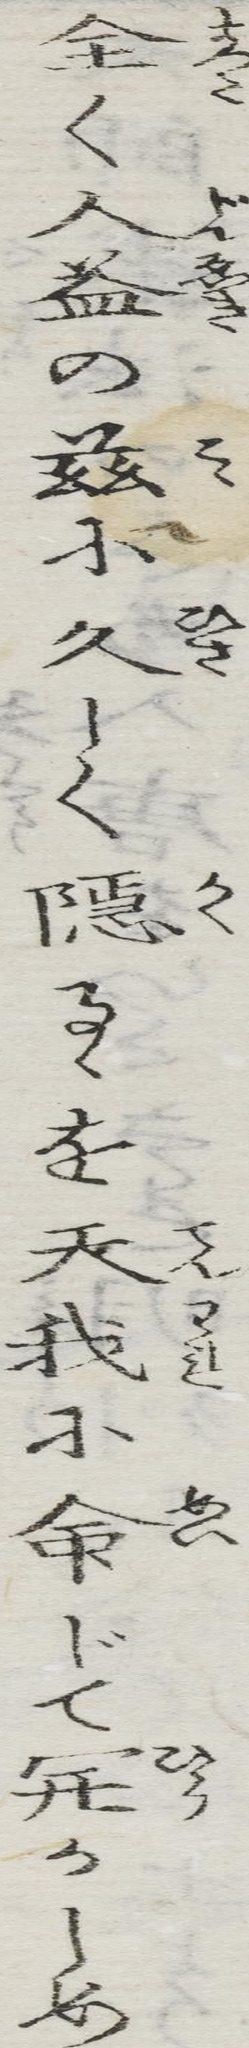全く人益の茲に久しく隠る〱を天我に命じて開かしめ
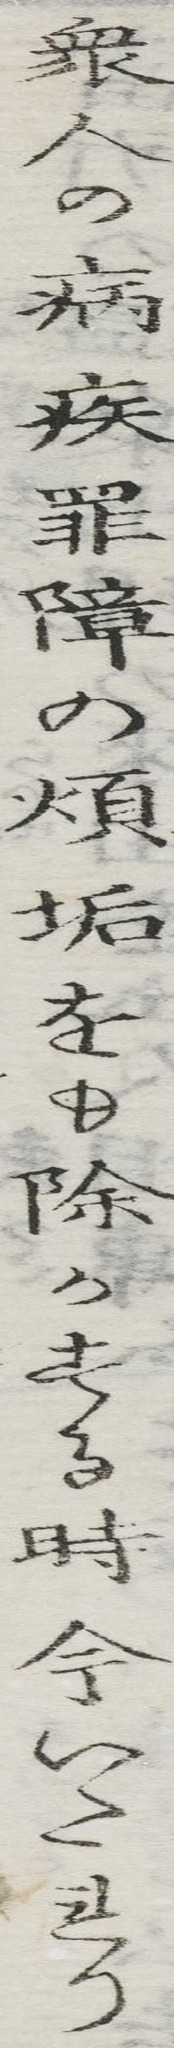衆人の病疾罪障の煩垢をも除かする時今いたれり
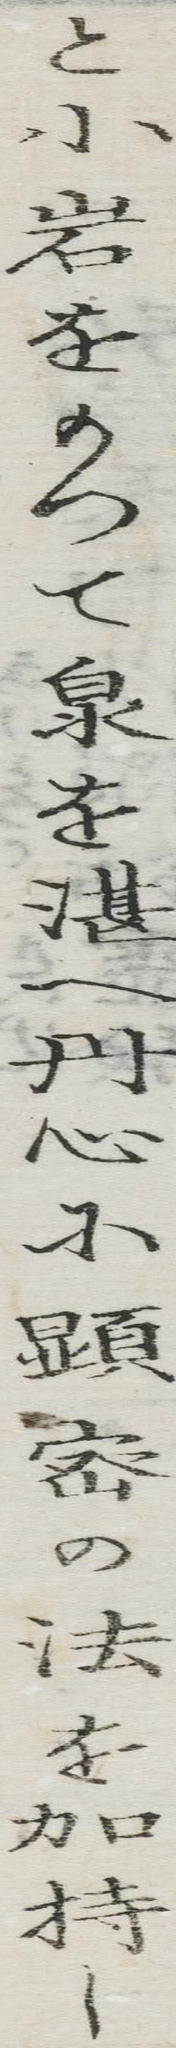と小岩をかつて泉を湛へ丹心に顕宻の法を加持し
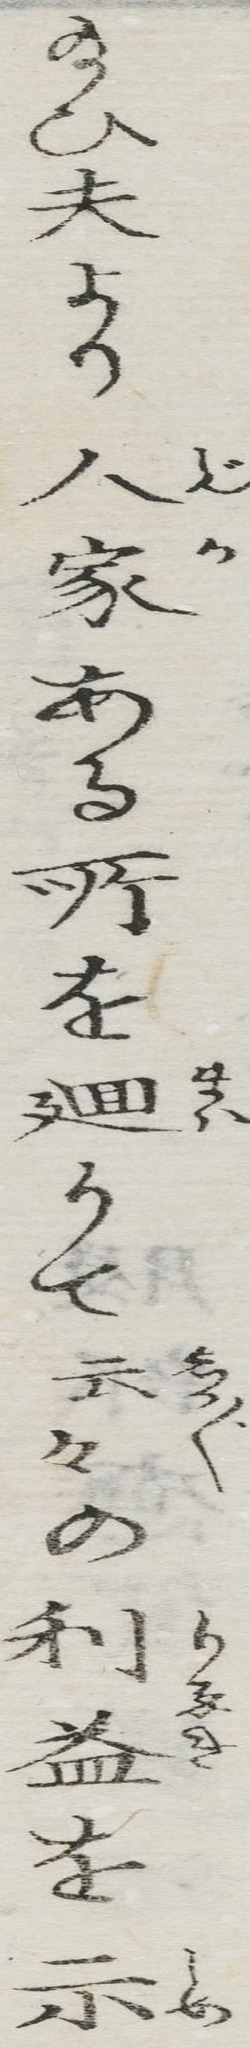給ひ夫より人家ある所を廻りて云々の利益を示
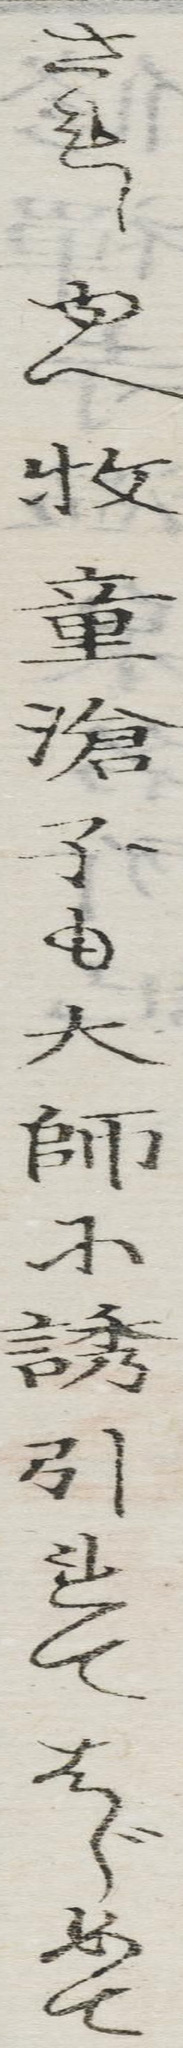されてゆへ牧童滄子も大師に誘引れてはじめて
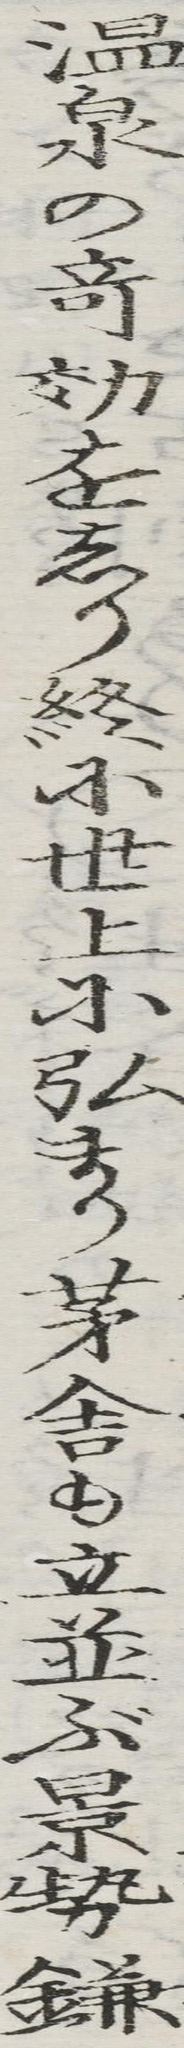温泉の奇効を志り終に世上に弘まり茅舎も立並ぶ景勢鎌
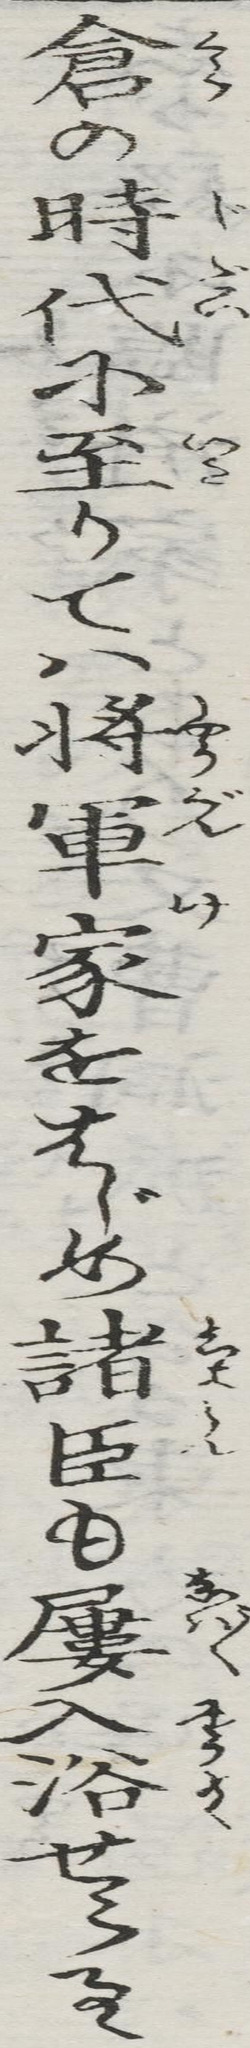倉の時代に至りてハ将軍家をはじめ諸臣も屢入浴せらる〱
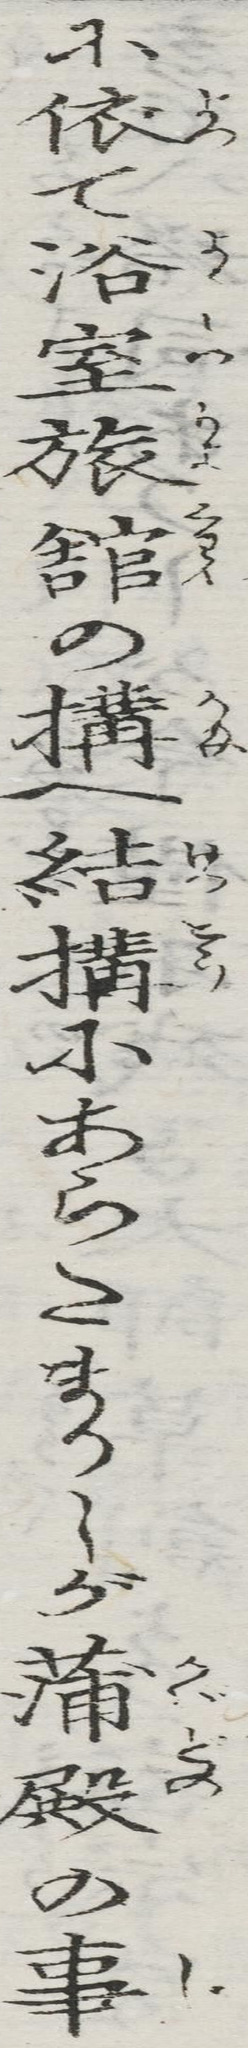に依て浴室旅館の構へ結構にあらたまりしが蒲殿の事
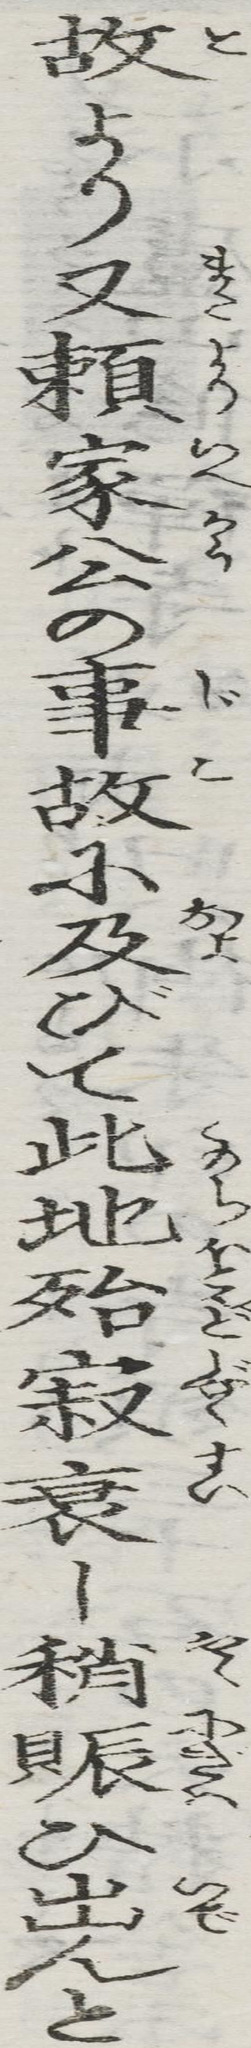故より又頼家公の事故に及びて此地殆寂衰し稍賑ひ出んと
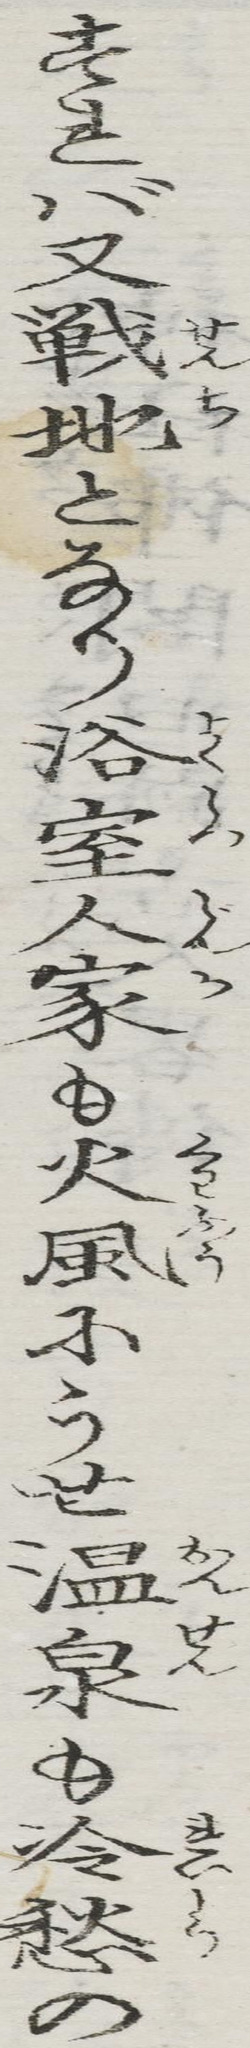すれバ又戦地となり浴室人家も火風にうせ温泉も冷愁の
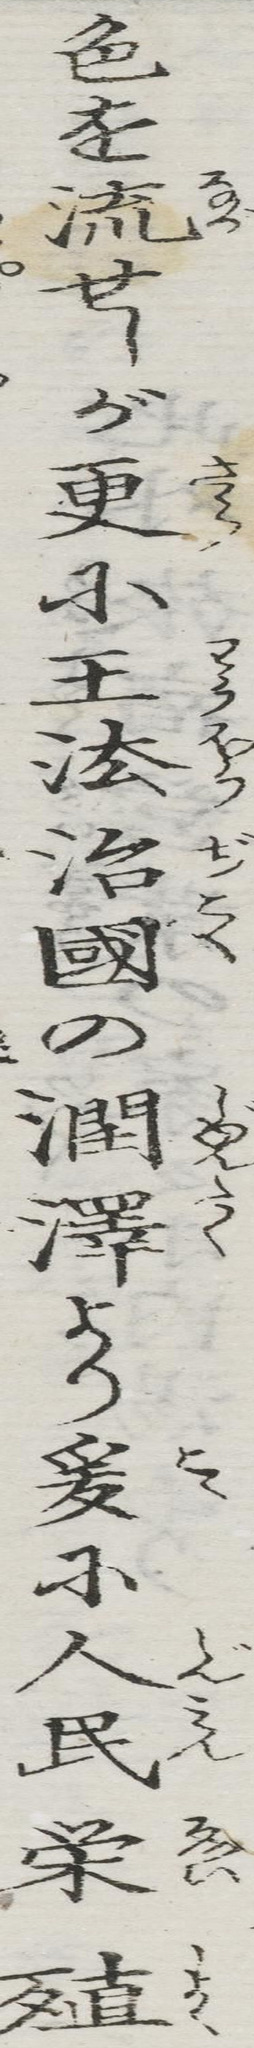色を流せしが更に王㳒治國の潤澤より爰に人民栄殖
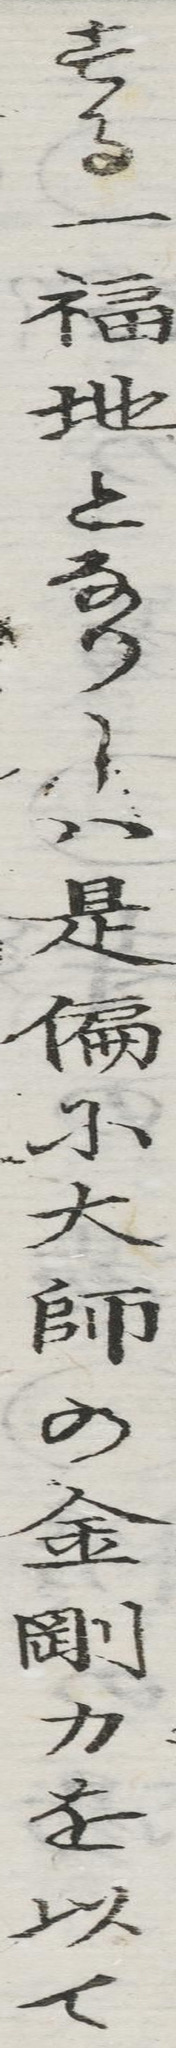する一福地となりしハ是偏に大師の金剛力を以て
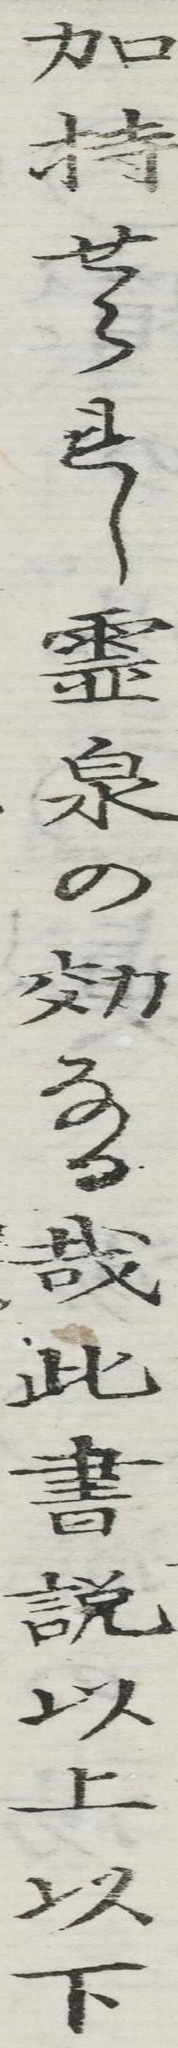加持せられし霊泉の効給哉此書説以上以下
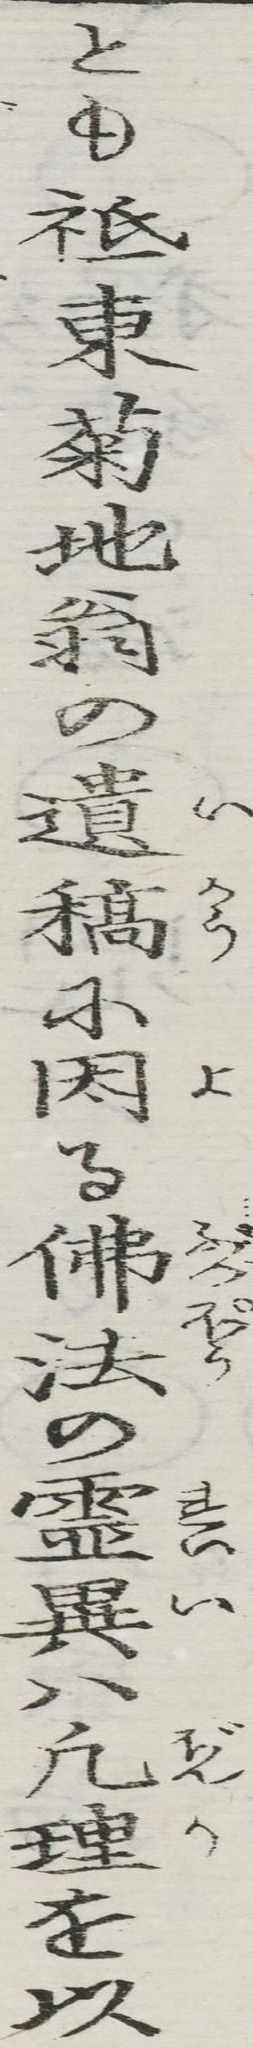とも祇東菊池翁の遺稿に因る佛法の霊異ハ凢理を以
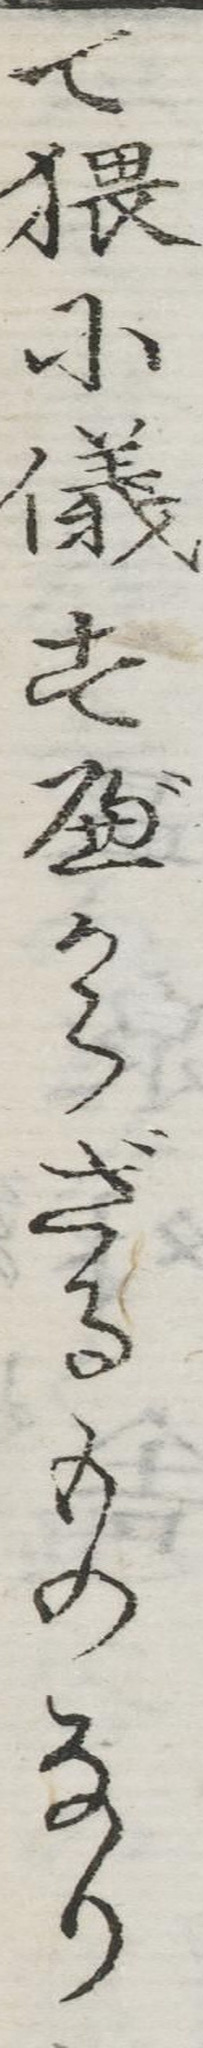て猥に儀すべからざるものなり

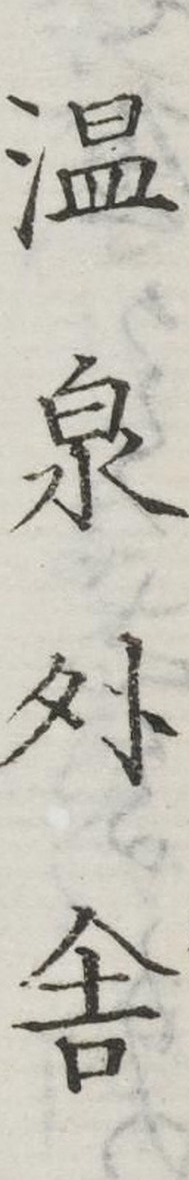温泉外舎
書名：伊豆国修善寺温泉名所記　全
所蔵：東京大学地震研究所図書室 Earthquake Research Institute Library, The University of Tokyo, JAPAN
